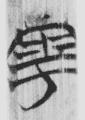𩁹
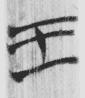王
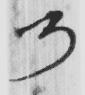乃
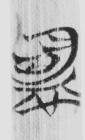盟
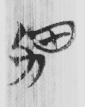男
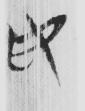女
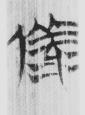備
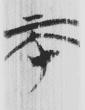帀
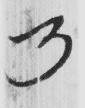乃
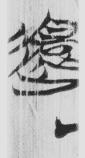還
